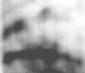二
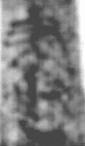○（畫）
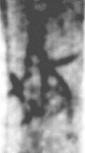○（伐）
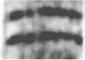二
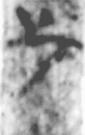戈
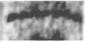一
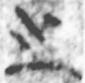之
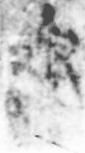顯（韅）
